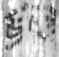寅
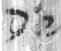卯
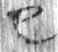巳
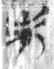未
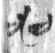申
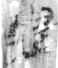是
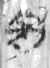胃（謂）
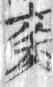赤
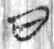日
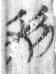利（利）
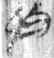於
